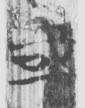或
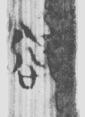欲
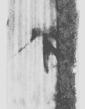大
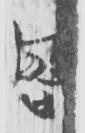啟
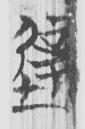壁
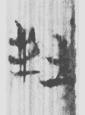{土丰}
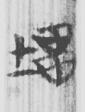{土田田}
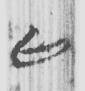㠯（以）
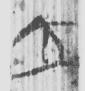立
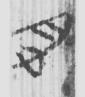名
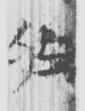於
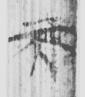天
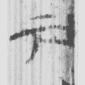下
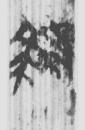{衰欠}
